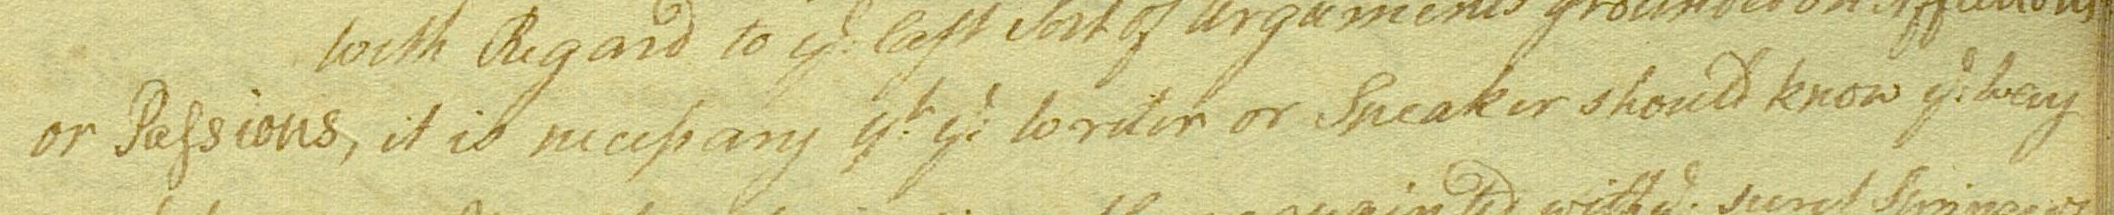or Passions, it is necessary y^e y^e Writer or Speaker should know y^e: key
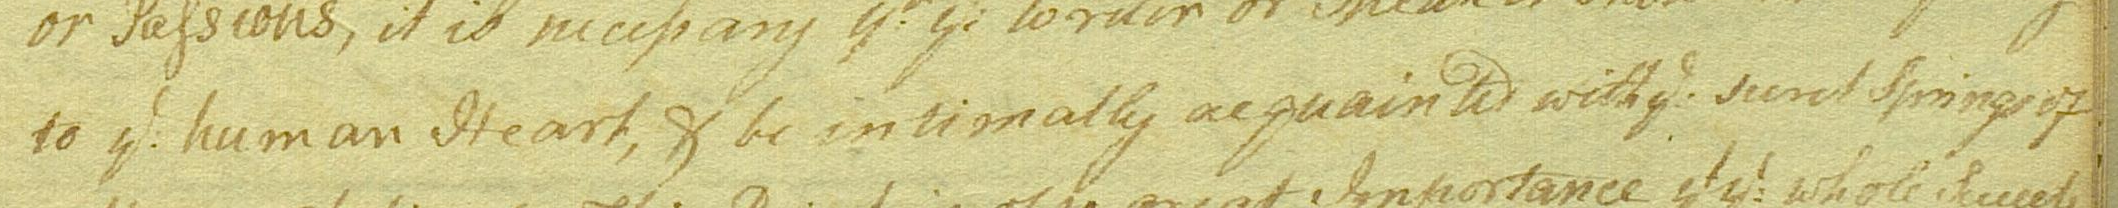to y^e: human Heart, & be intimately acquainted with y^e: secret springs of
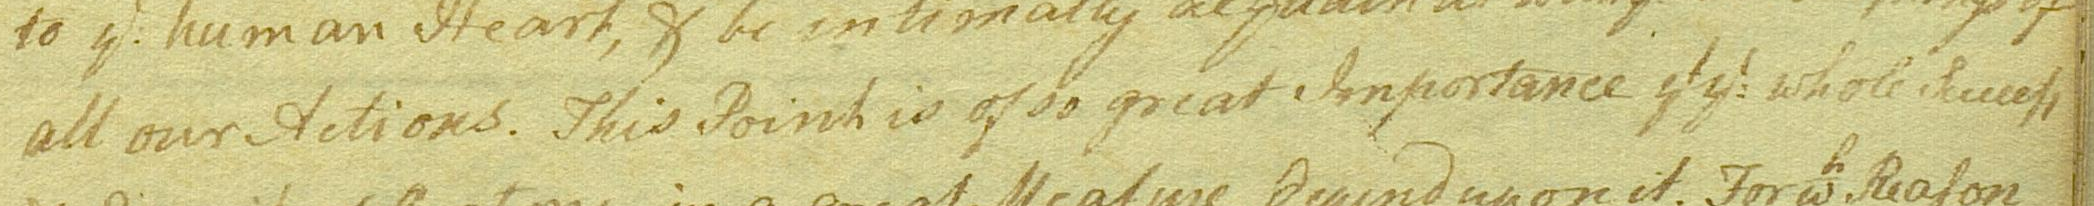all our Actions. This Point is of so great Importance y^t y^e: whole success
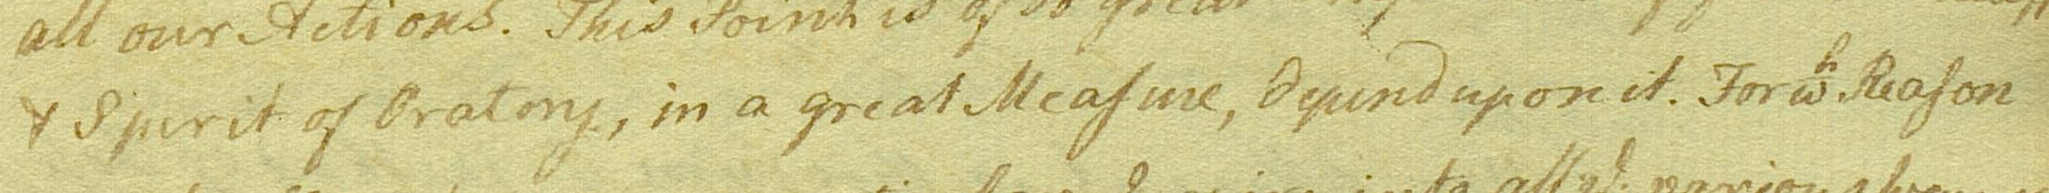& Spirit of Oratory, in a great Measure, depend upon it. For w^h Reason
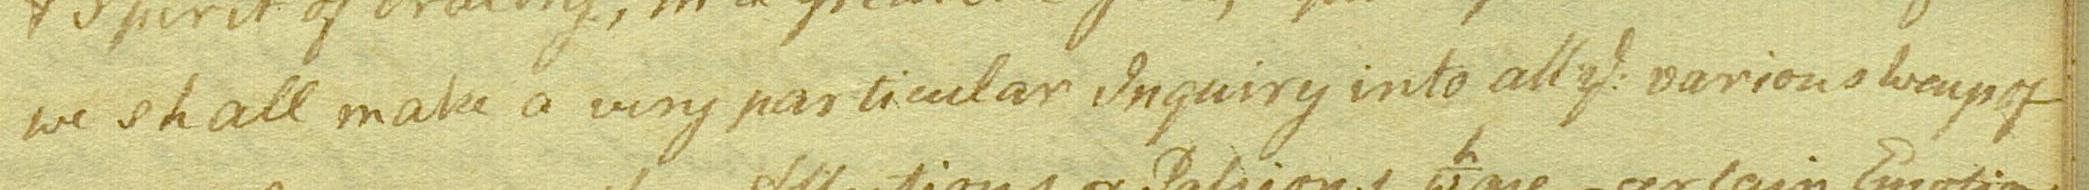we shall make a very particular Inquiry into all y^e: various ways of
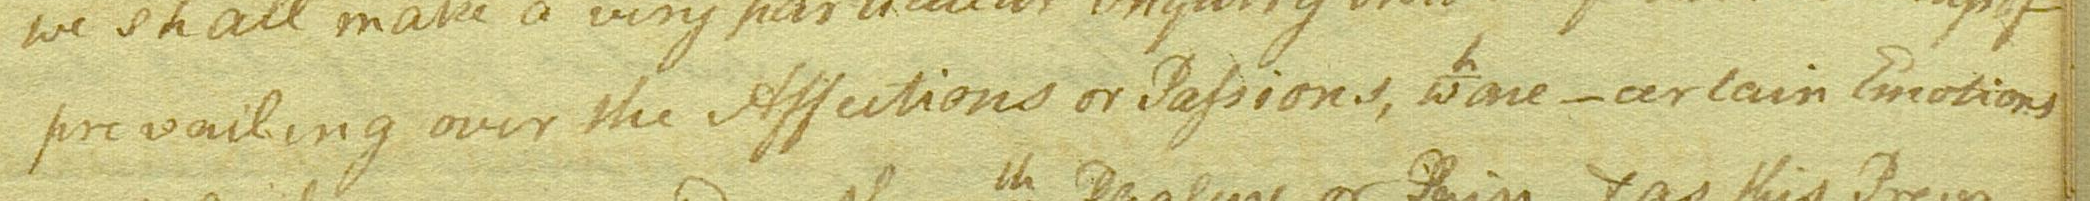prevailing over the Affections or Passions, w^h are– certain Emotions
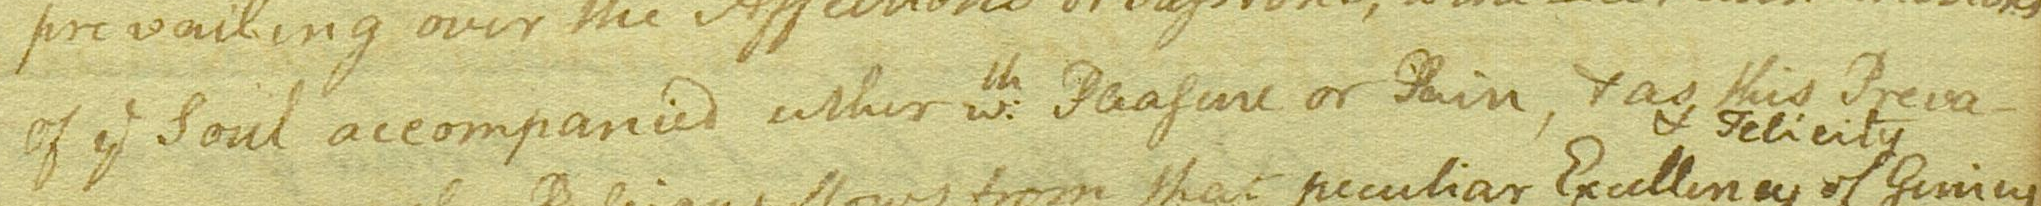of y^e Soul accompanied either w^th: Pleasure or Pain, & as this Preva-
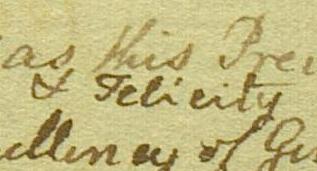& Felicity
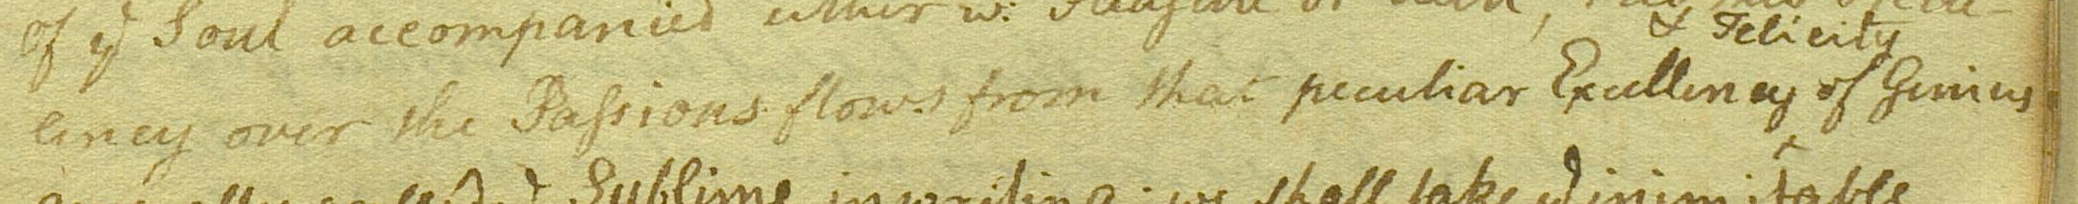lency over the Passions flows from that peculiar Excellency ^ of Genius
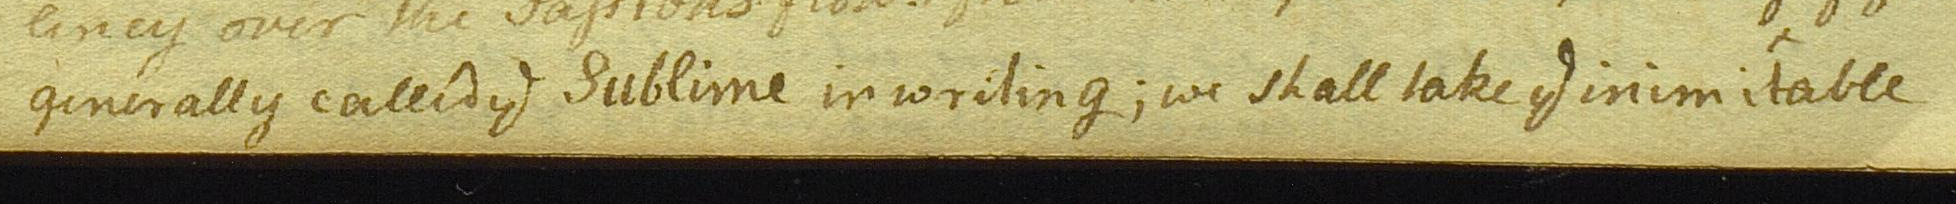generally called y^e Sublime in writing; we shall take of inimitable
